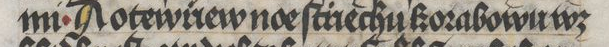mi.A otewřiew noe ſtṙiechu korabowu wz¬
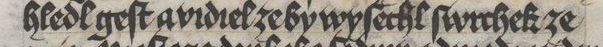hledl geſt a vidiel ze by wyſechl ſwrchek ze¬
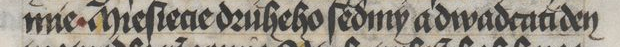mie.Mieſiecie druheho ſedmy a dwadcati den
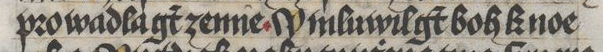prowadla ḡt zemie.Y mluwil ḡt boh k noe¬
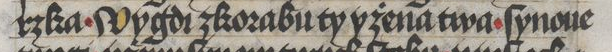rzka.Vygdi zkorabu ty y żena twa.ſynoue
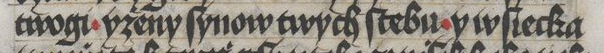twogi.yżeny ſynow twych ſtebu.y wſiecka
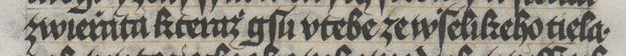zwieřata kteraž gſu vtebe ze wẛelikeho tiela.
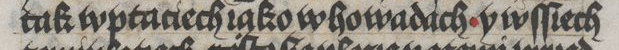tak wptacíech iako w howadach.y wſſiech
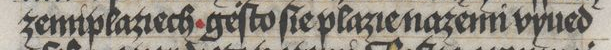zemiplaziech.geẛto ſie plazie nazemi vyned¬
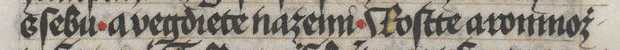sſebu.a vegdiete nazemi.Roſtte a romnoż¬
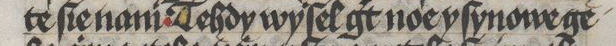te ſie nani.Tehdy wyẛel ḡt noe y ſynowe ge¬
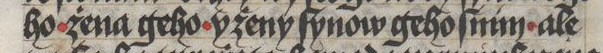ho.żena geho.y ženy ſynow geho ſním.ale
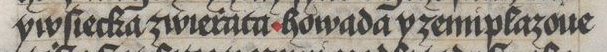y wſiecka zwieṙata.howada y zemi plazoue
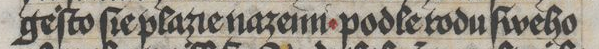geẛto ſie plazie nazemi.podle rodu ſweho
